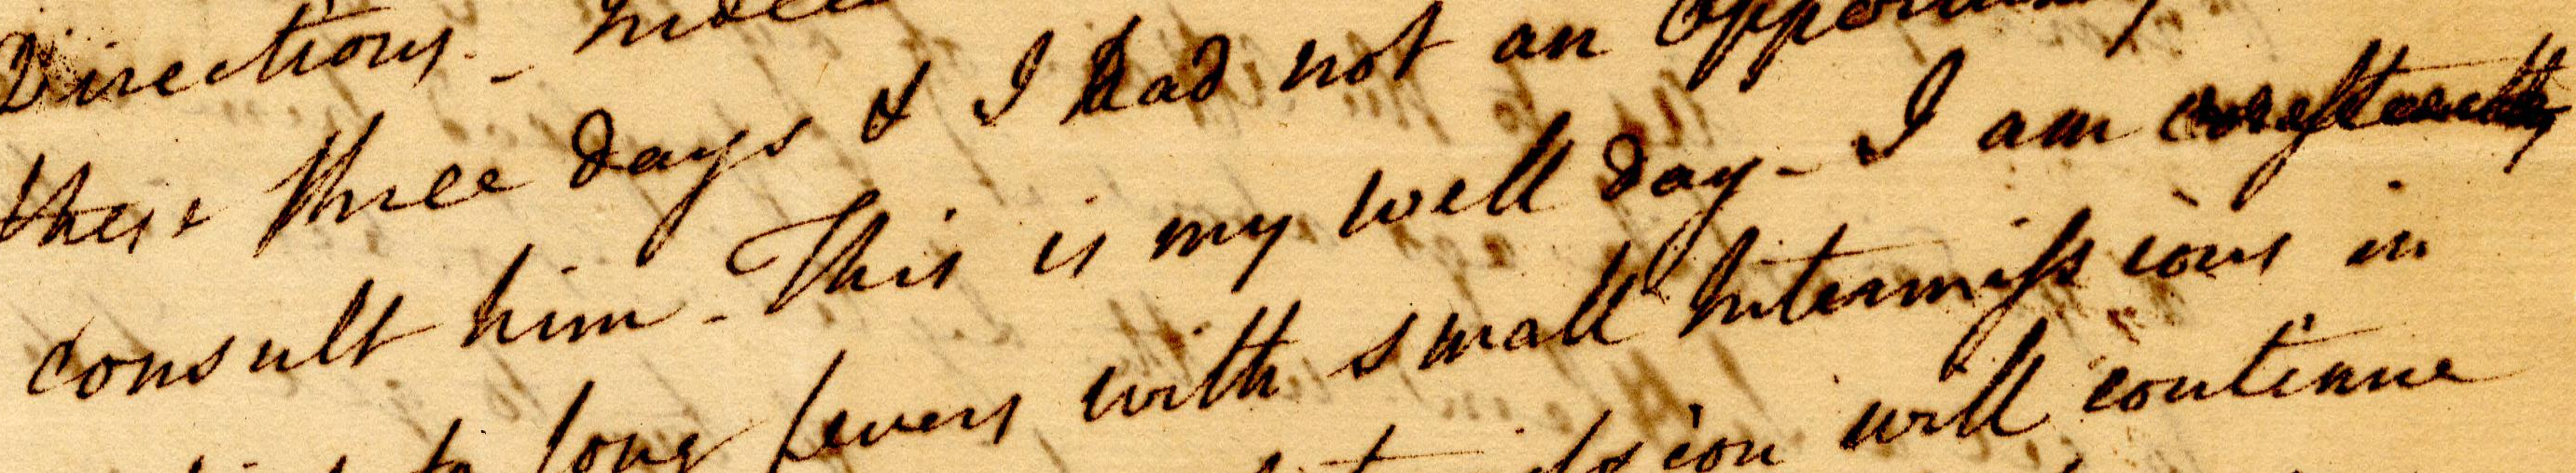consult him. This is my well day. I am constantly
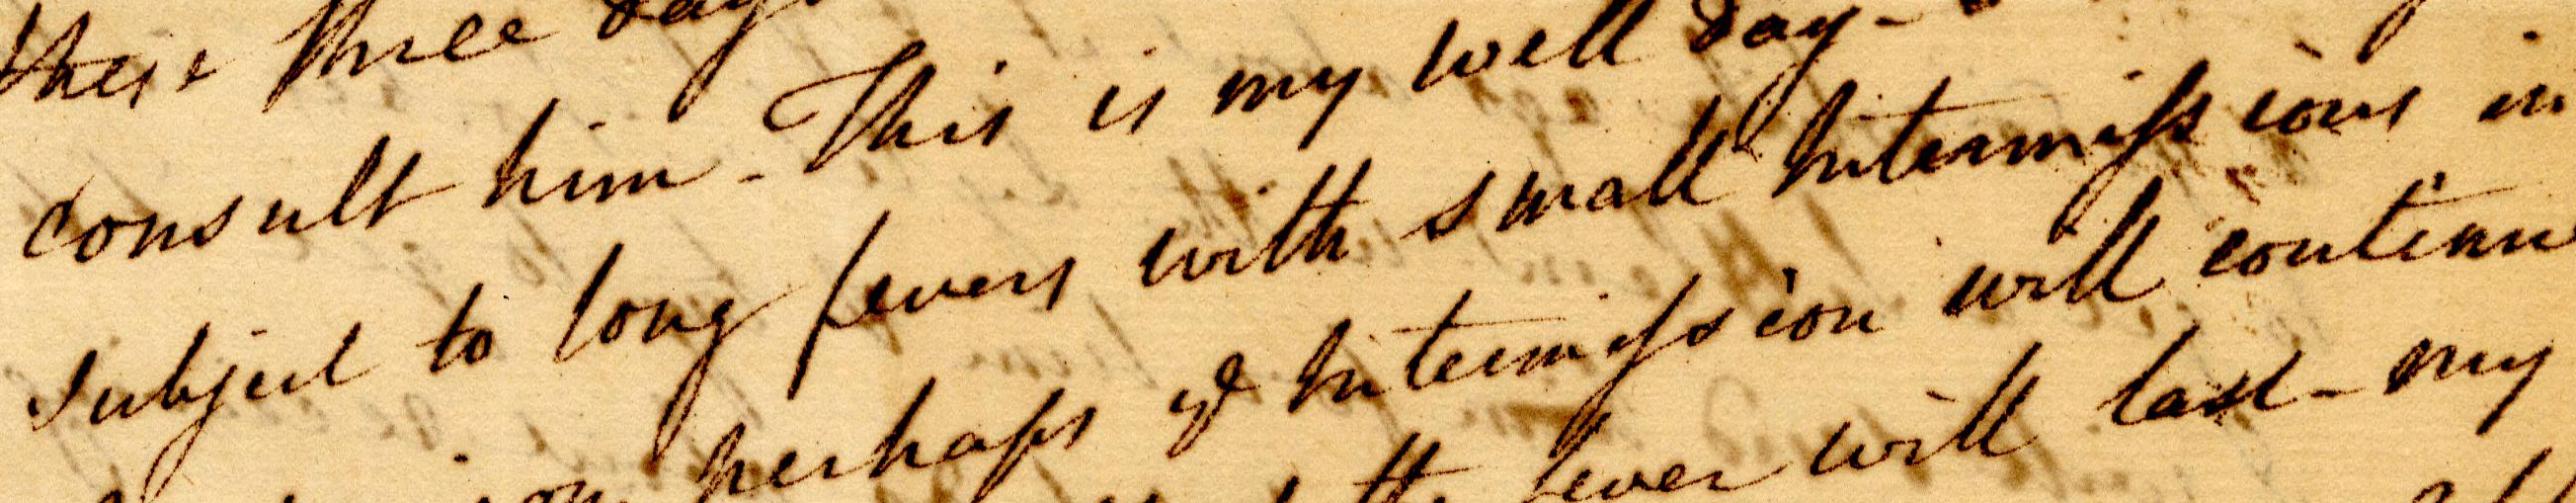subject to long fevers with small Intermissions in
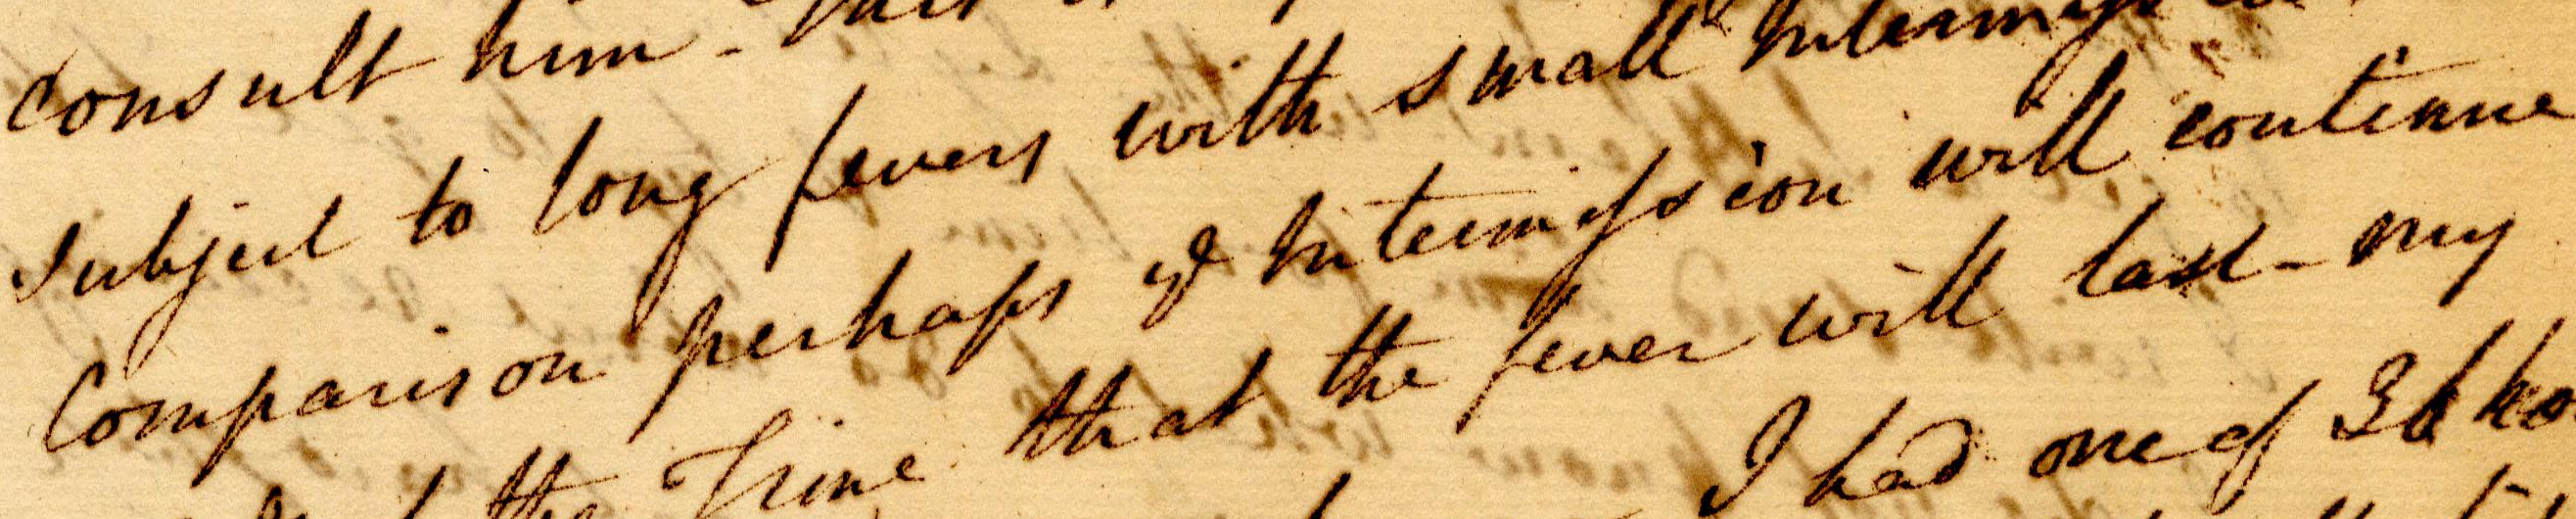Comparison perhaps y^e Intermission will continue
